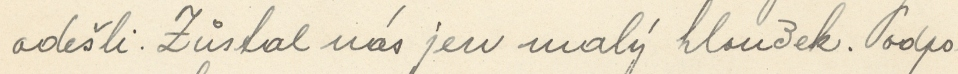odešli. Zůstal nás jen malý hlouček. Podpo-
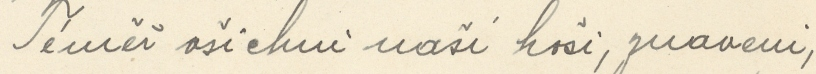Téměř všichni naší hoši, znaveni,
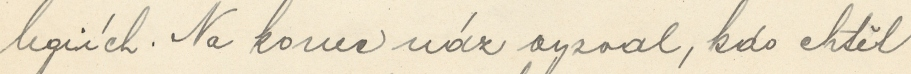legiích. Na konec náz vyzval, kdo chtěl
